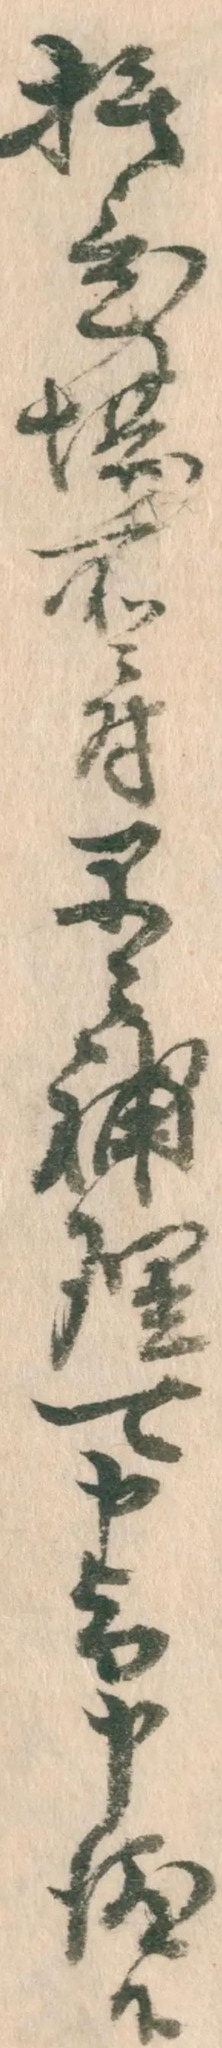捨置場所ニ付早〻補理可申旨申渡候
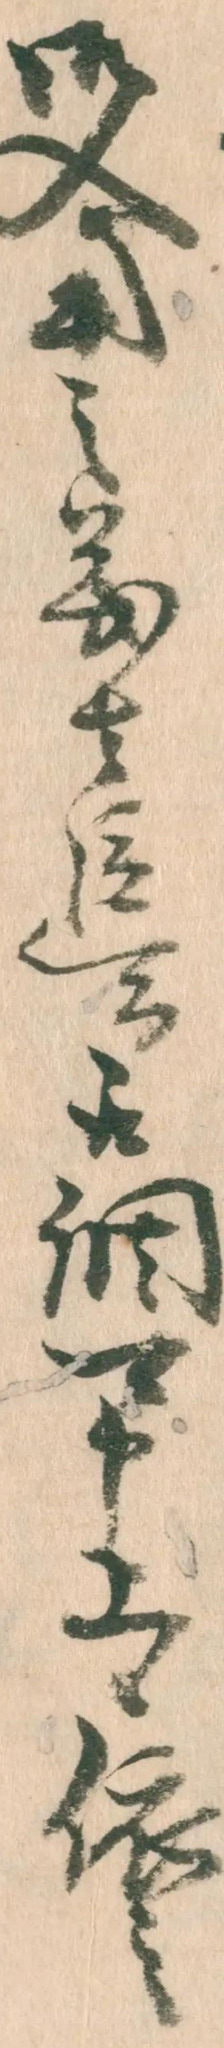御入用之義は追て取調可申上候依之
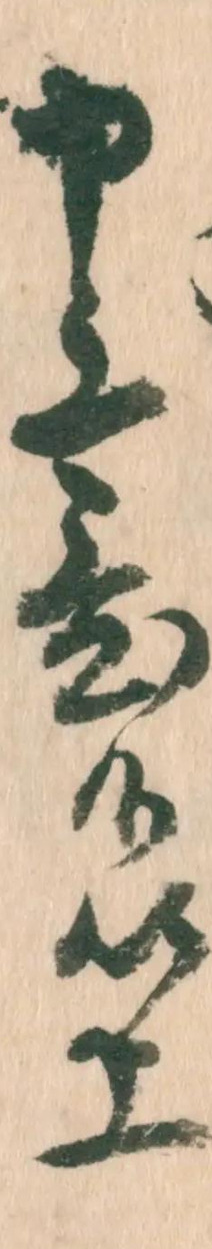申上置候以上
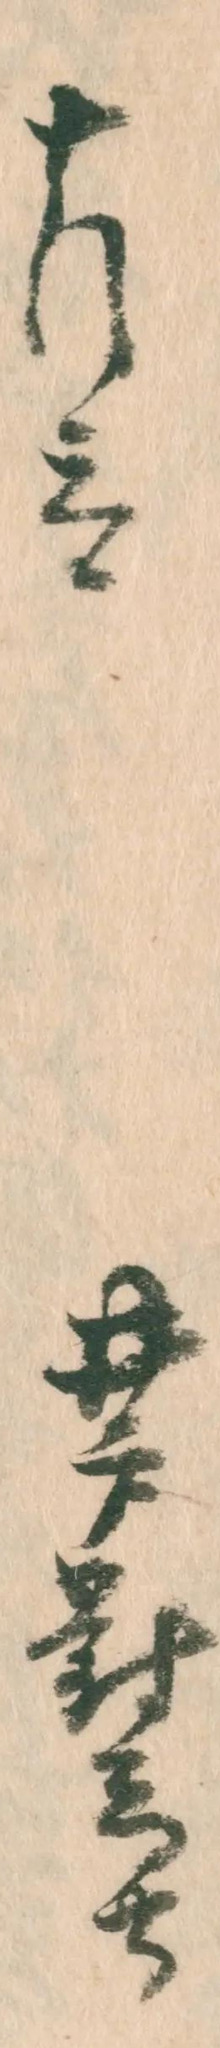十月三日井戸対馬守
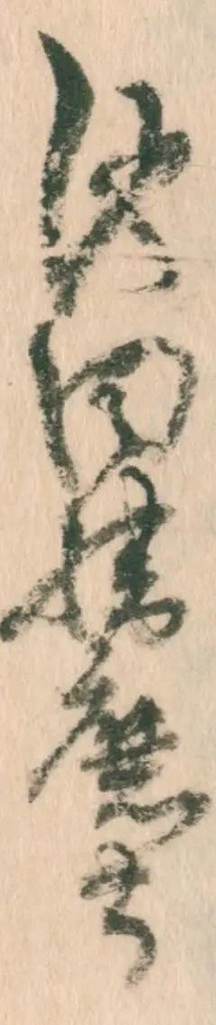池田播磨守
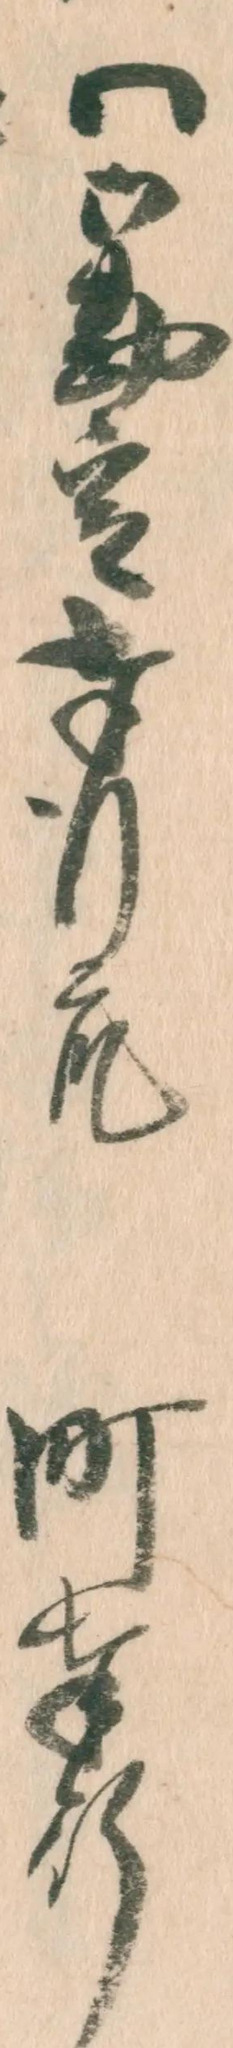│[御勘定奉行衆町奉行
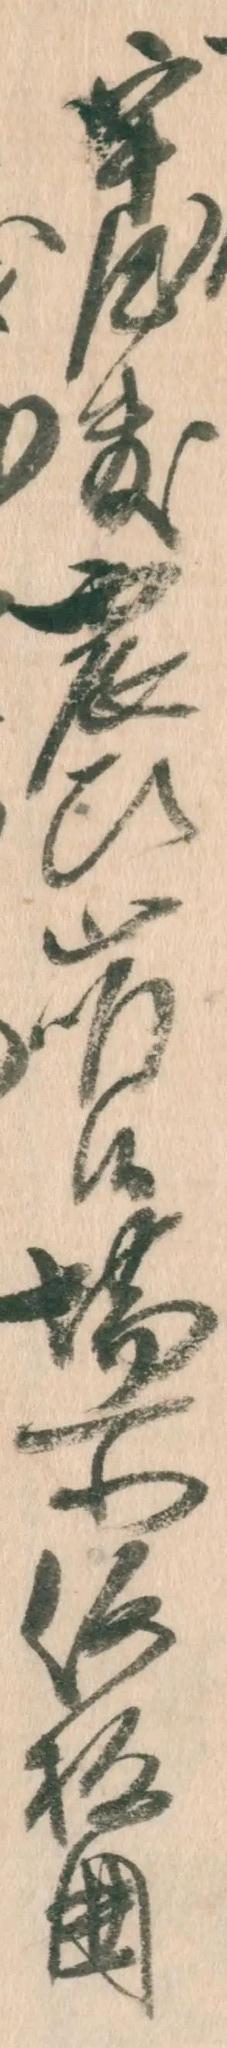牢屋敷震ひ崩候場所仮板囲
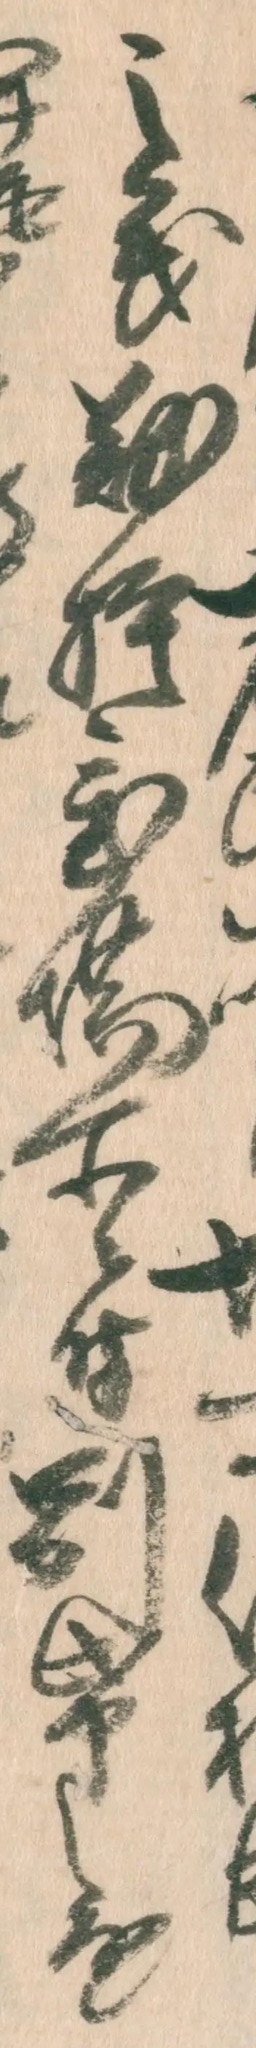之義難捨置場所ニ付別紙之通
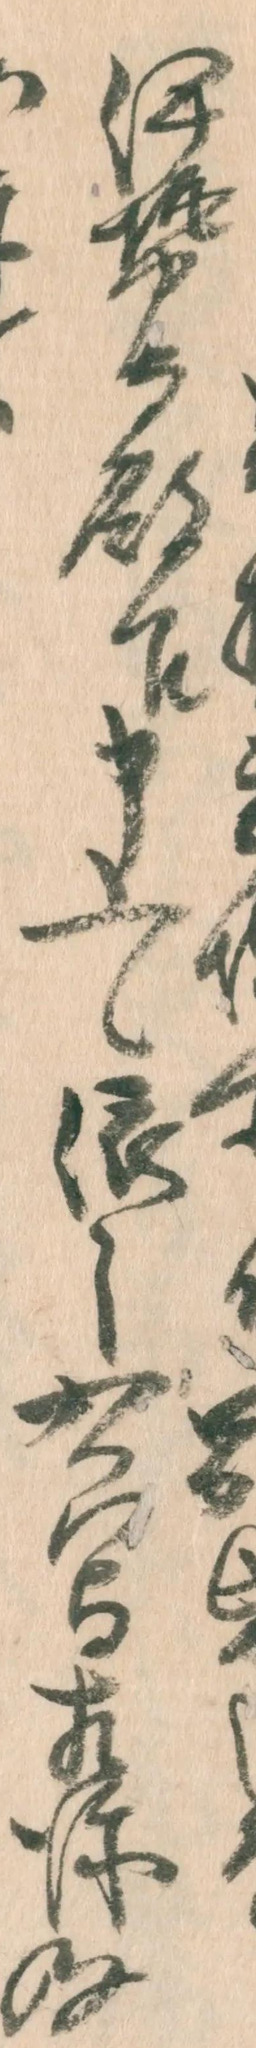伊㔟守殿え申上候依之右写相添致
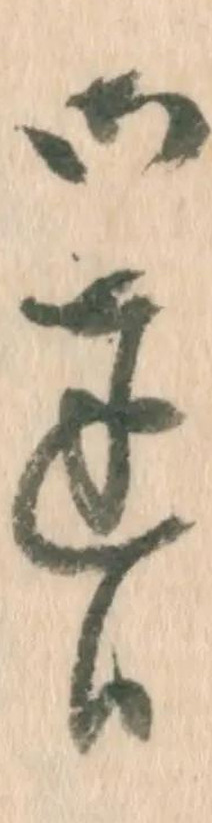御達候

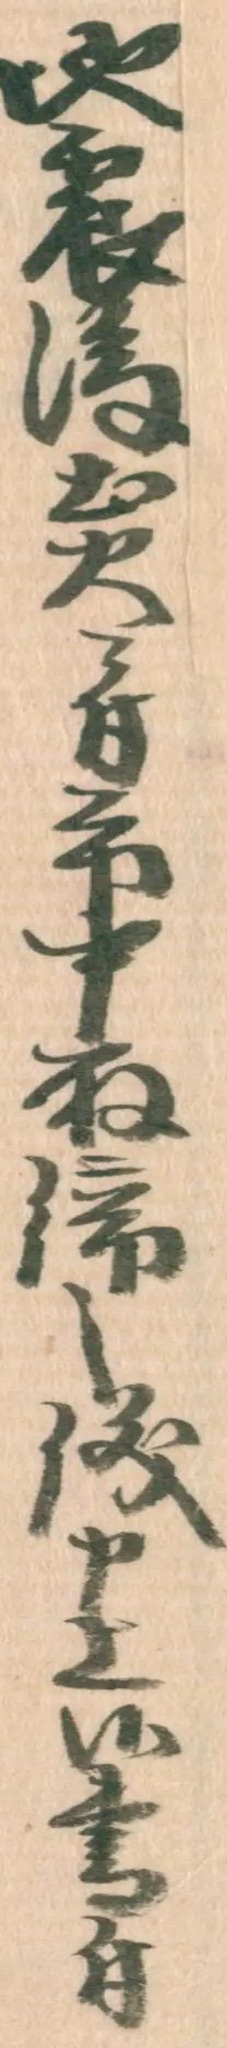│地震後出火ニ付市中取締之義儀申上候書付
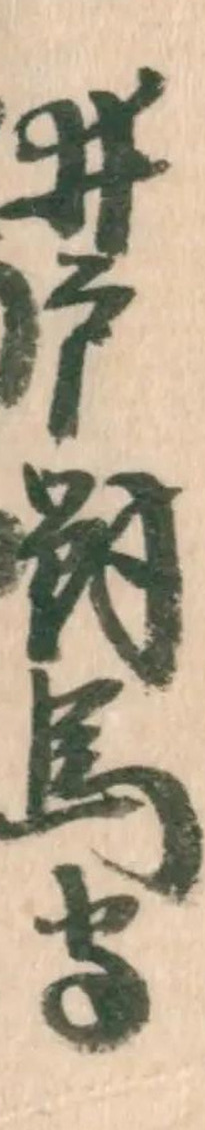│井戸対馬守
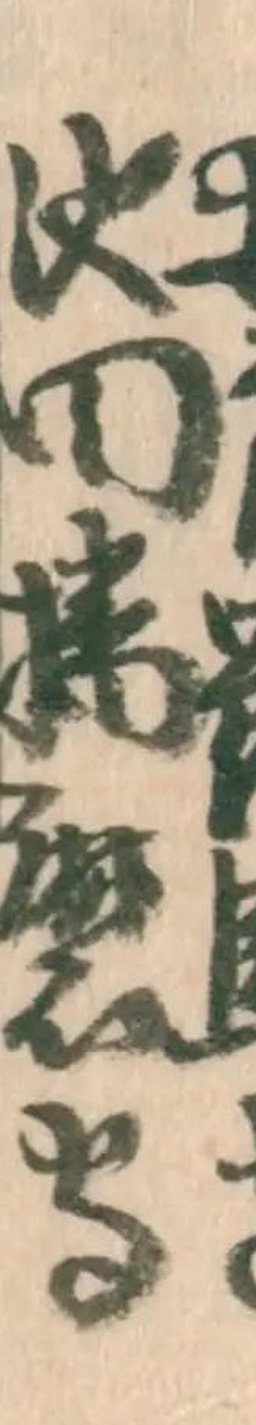│池田播磨守
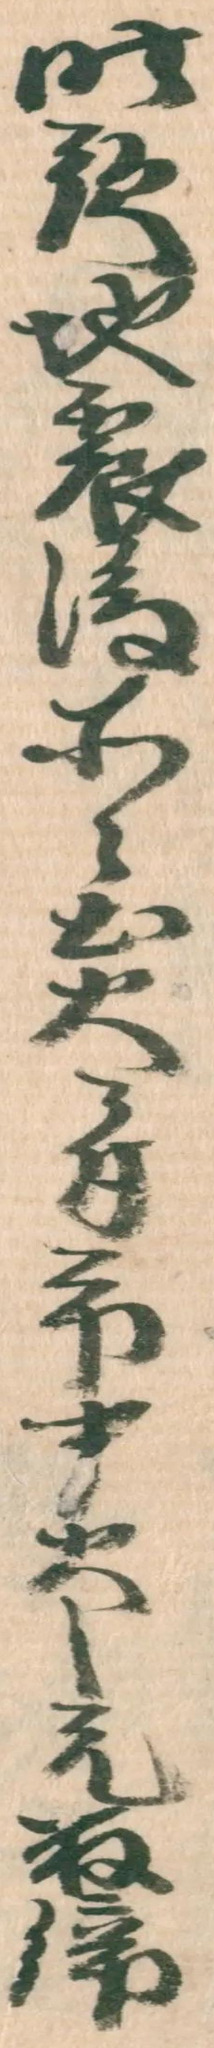昨夜地震後所〻出火ニ付市中火之元取締
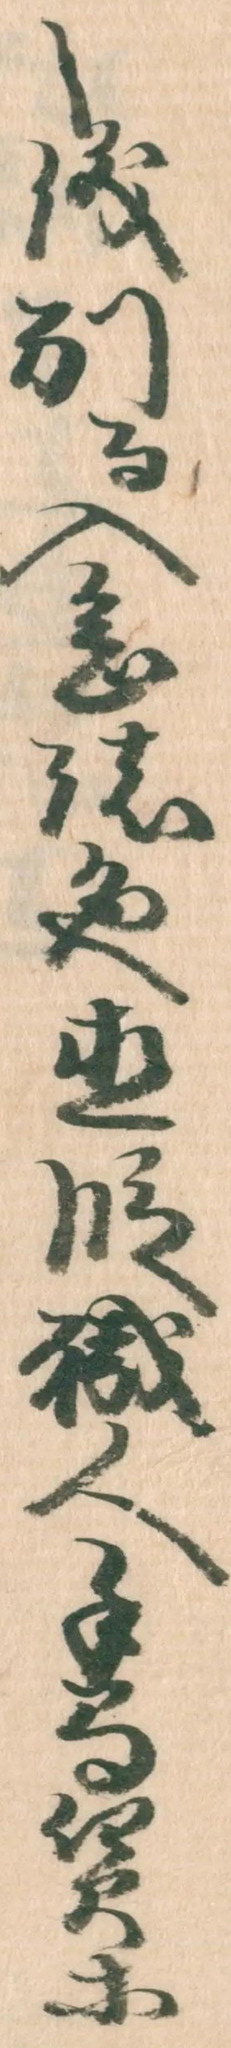之儀別て入念諸色直段職人手間賃等
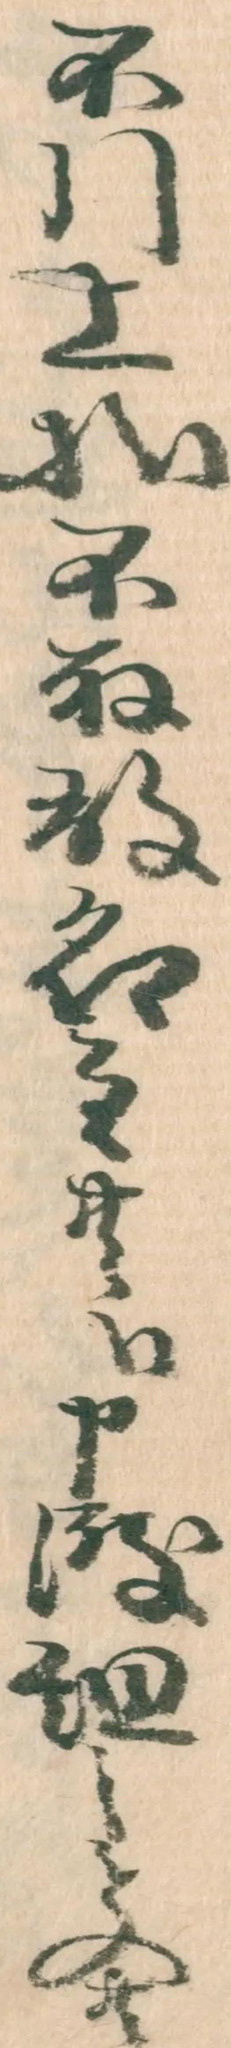不引上哉不取敢名主共え申渡組のもの共
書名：地震災書留 2巻. [2] 内表紙に「地震一件　安政二卯年十月」とあり
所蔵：国立国会図書館 National Diet Library, JAPAN
